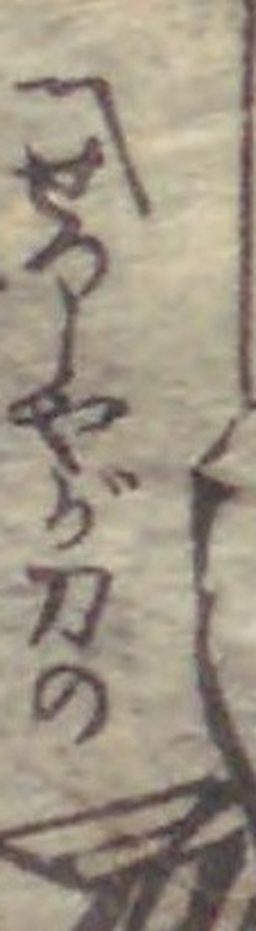〽せつしやが刀の
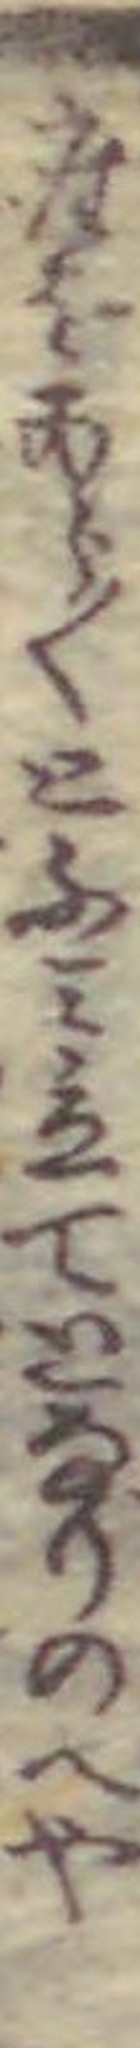座をあら〳〵とふみ立てとなりのへや
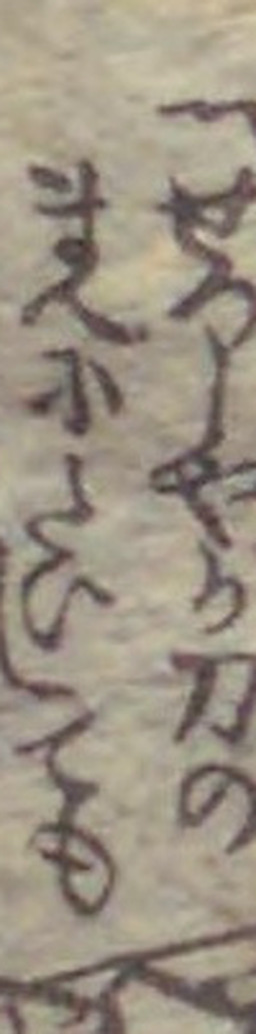まへにたいしても
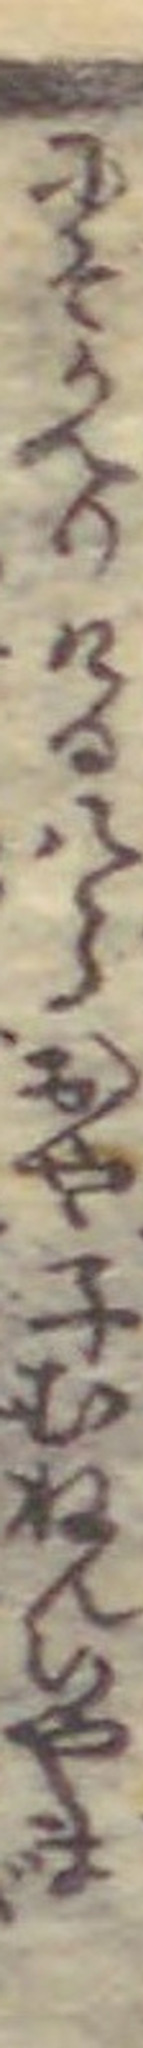にぞかへりける八郎おや子むねんいやま
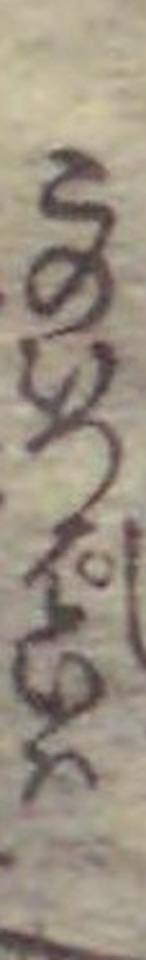このいつぱいは
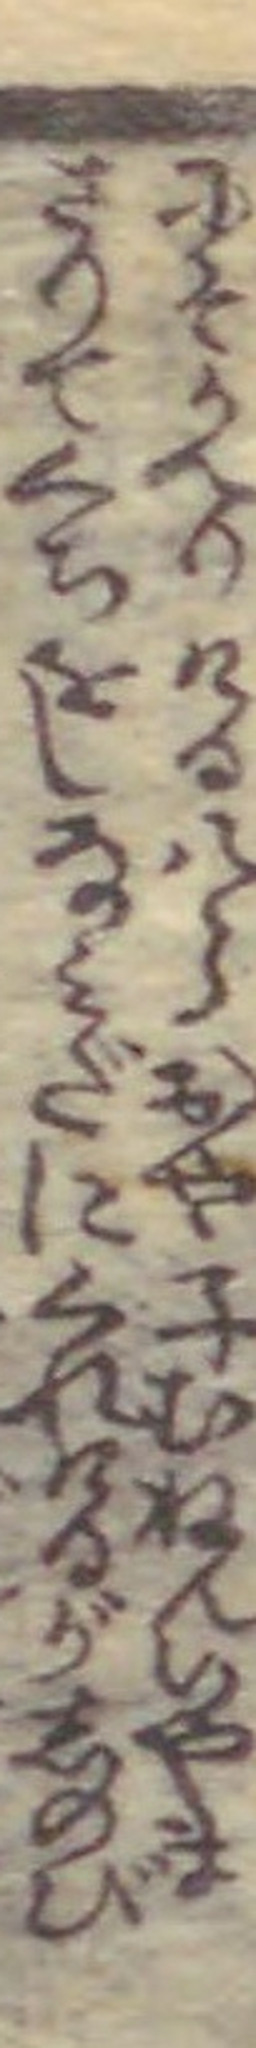さりてくちをしなみだにくれけるがしのび
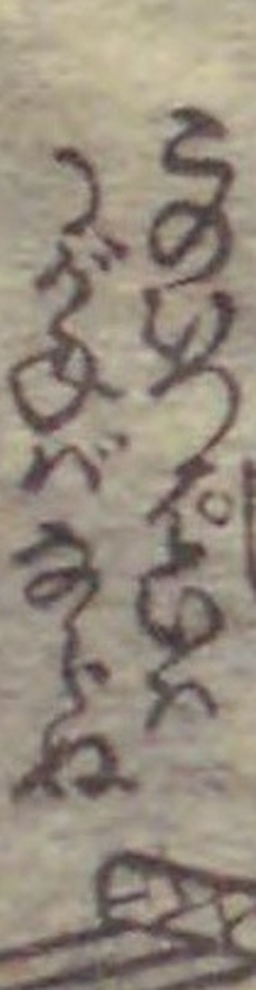つがねばならぬ
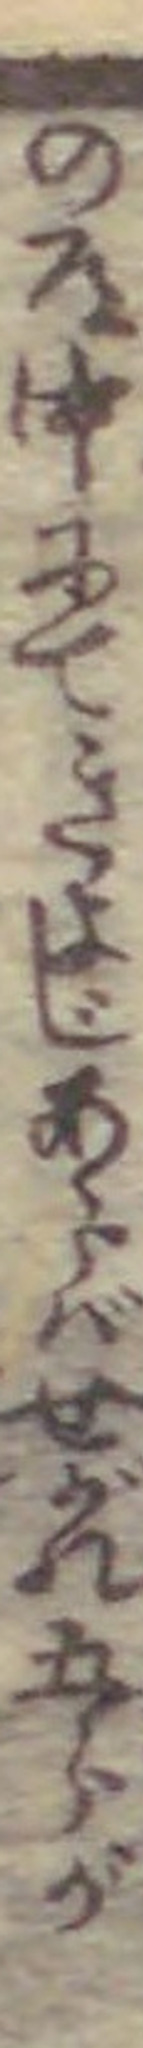の道中にてきよじあらばせがれ五郎が
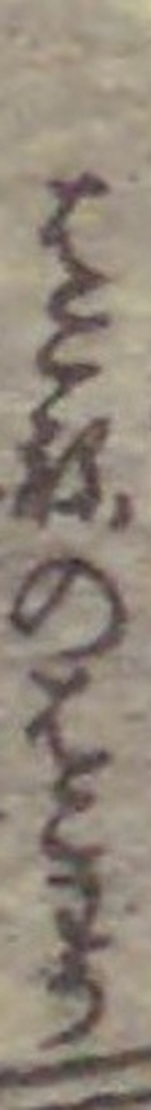はこねのはこわう
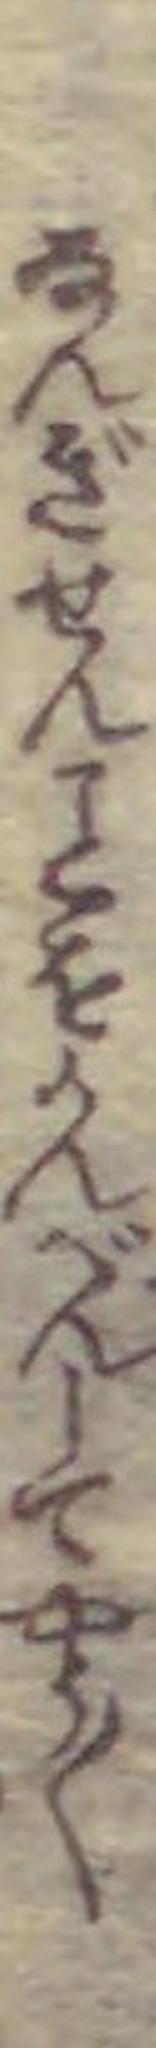なんぎせんことをかんべんしてやう〳〵
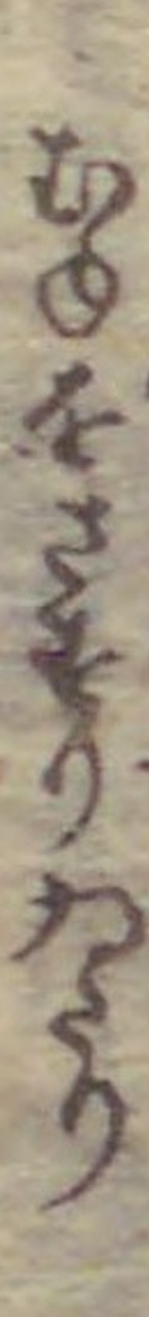むねをさすりゐたり
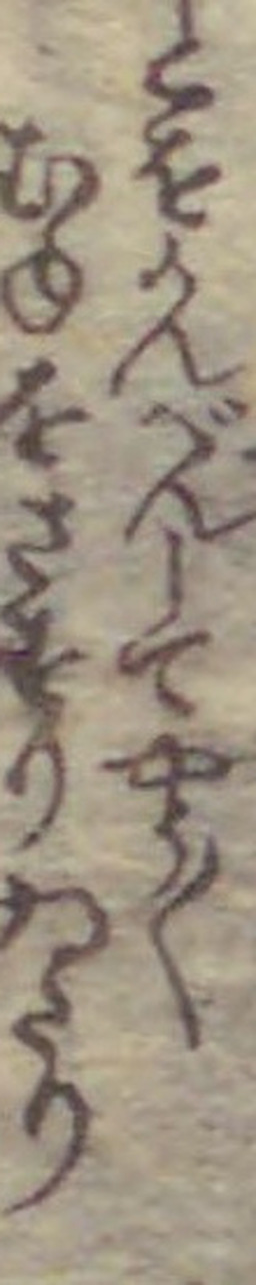むねをさすりゐたり

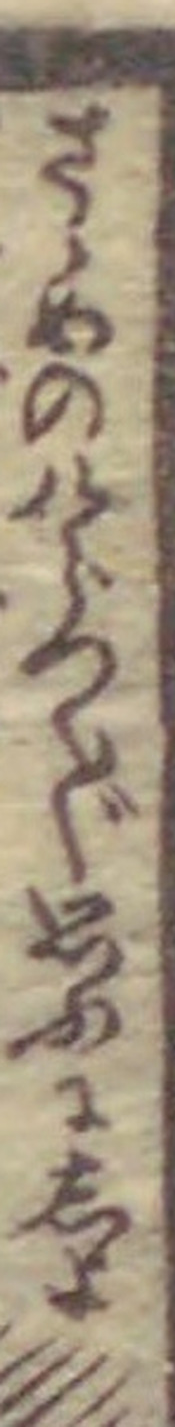さゝめの八郎つく〴〵思ふにしよ
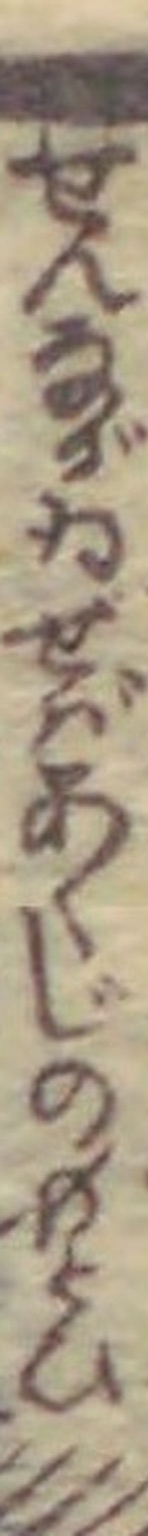せんながゐせばあくじのもとひ
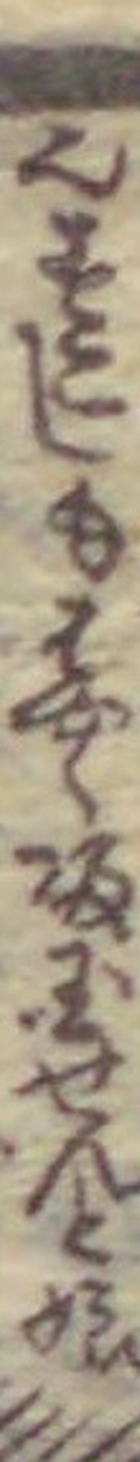也すこしもはやく帰国せんと娘
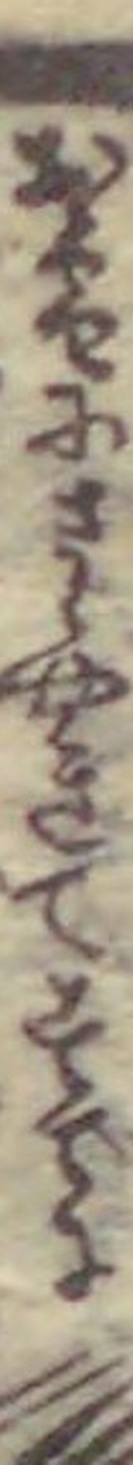お雪にさゝやきてすでに
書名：八ツ目鱣因縁物語 3巻
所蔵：国立国会図書館 National Diet Library, JAPAN
